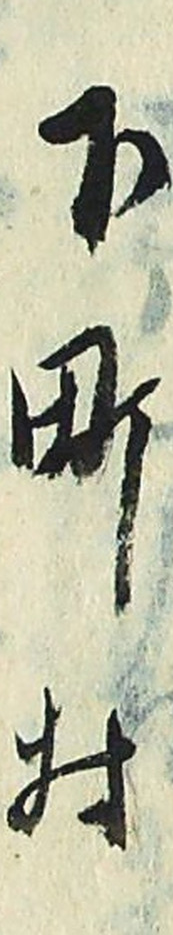下町村
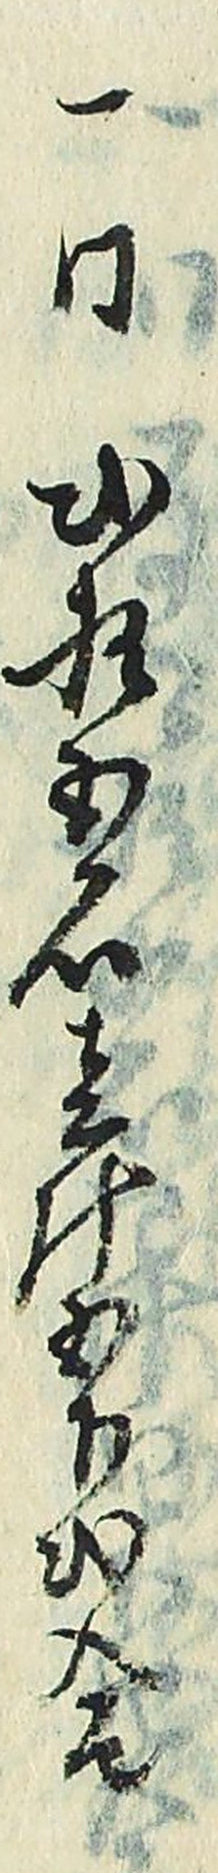一同弐拾五石壱斗五升弐合
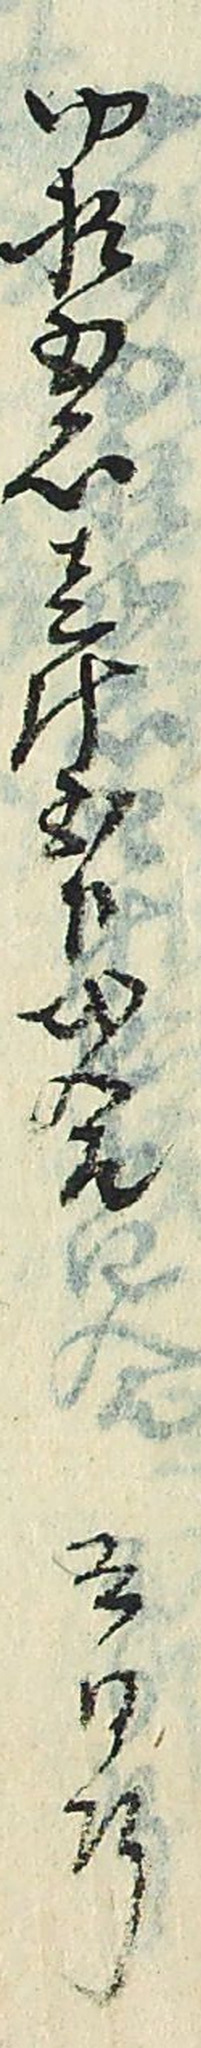内拾五石壱斗五升弐合右同断
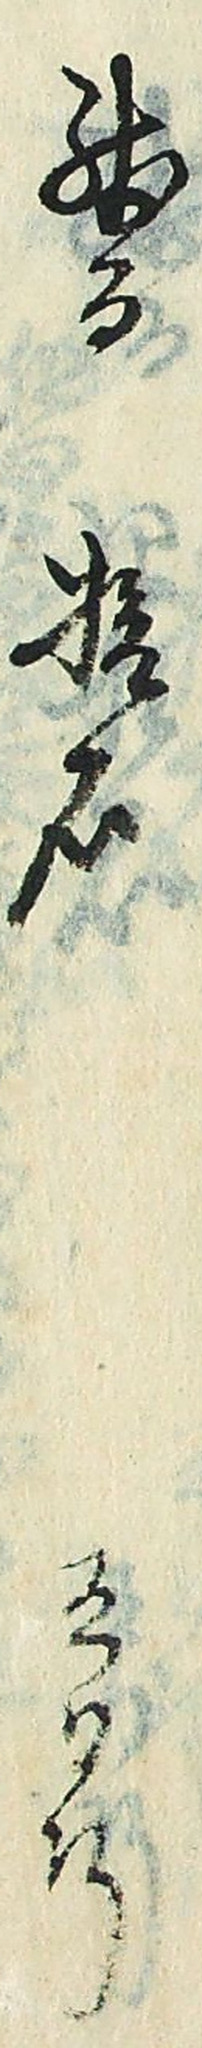残而拾石右同断
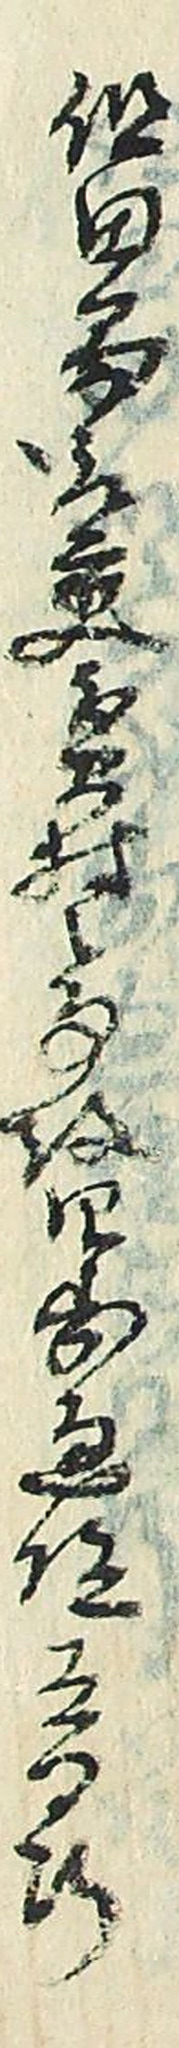但田畠取交貧村之事故四歩通位右同断

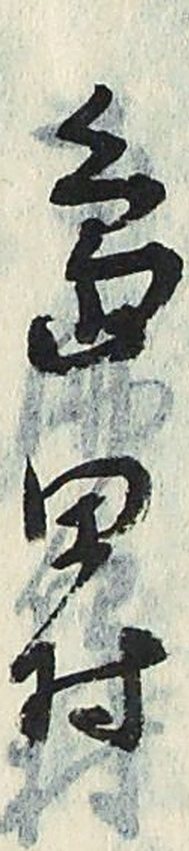島田村
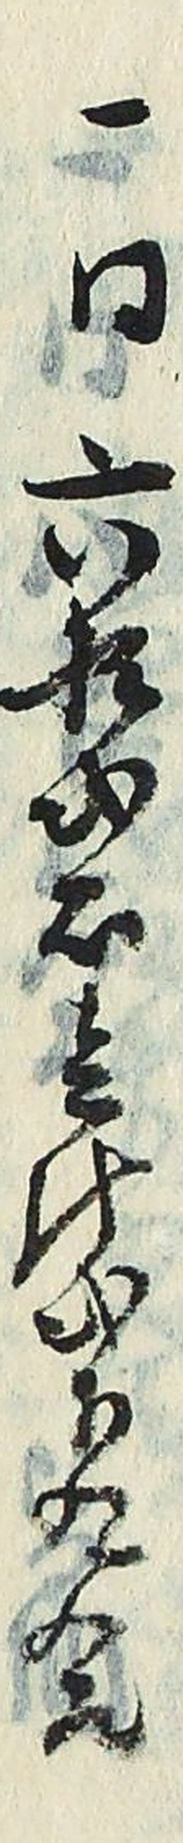一同六拾弐石壱斗弐升九合
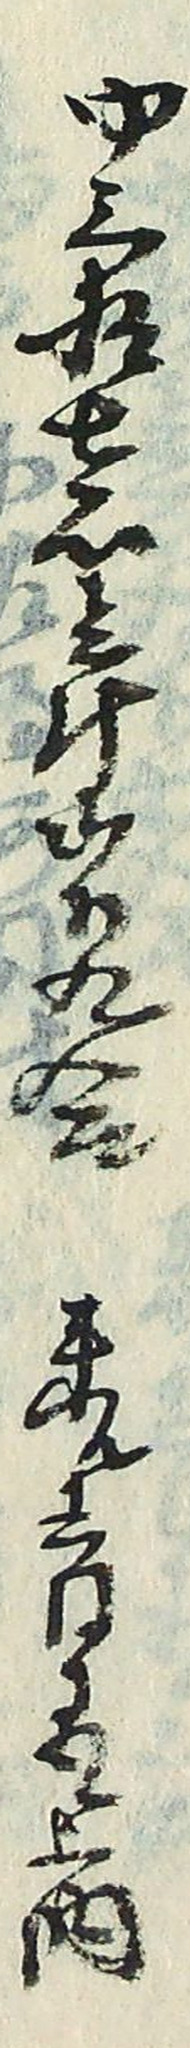内三拾七石壱斗弐升九合来ル十二月十五日上納
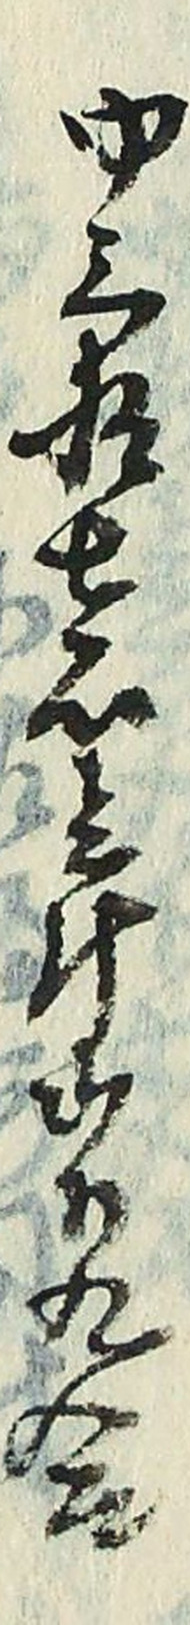一同六拾弐石壱斗弐升九合
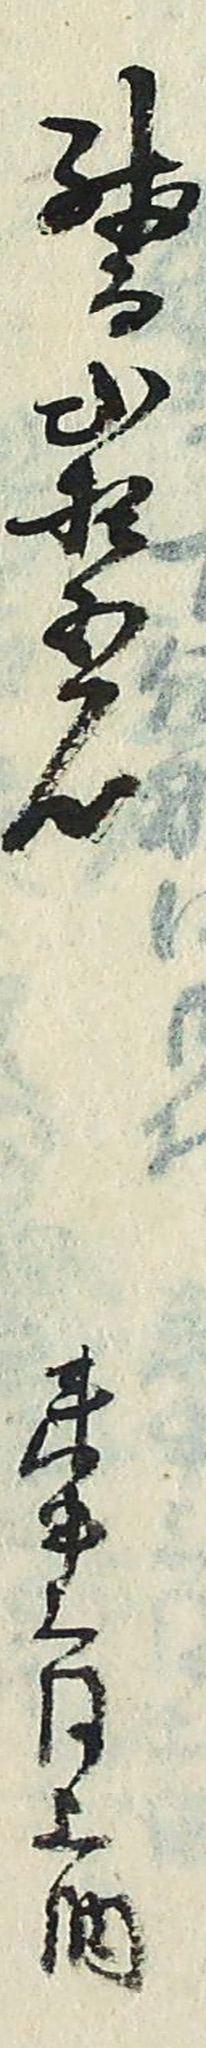残而弐拾五石来申三月上納
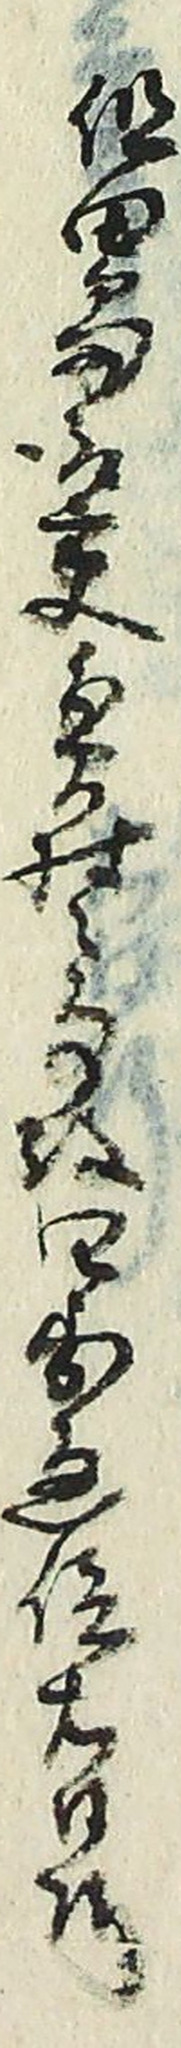但田畠取交貧村之事故四歩通位右同断
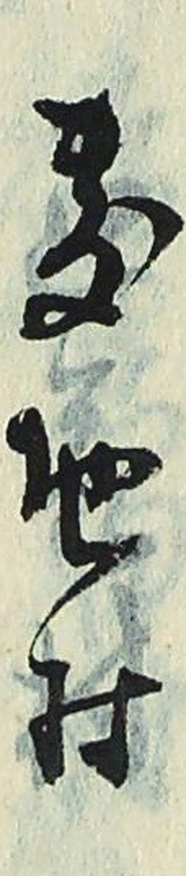敷地村
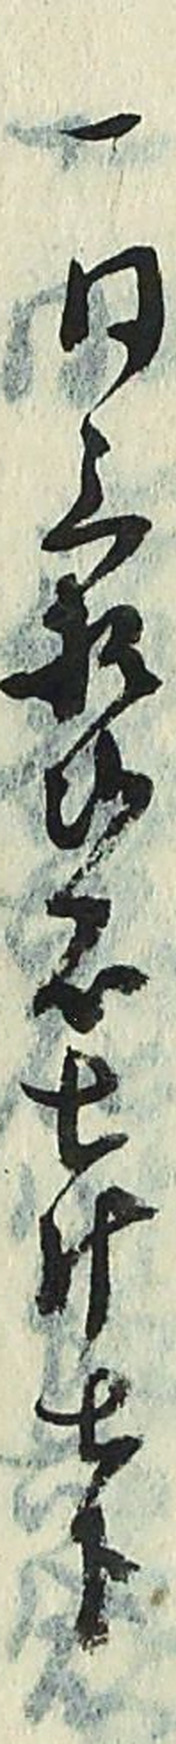一同三拾弐石七斗七升
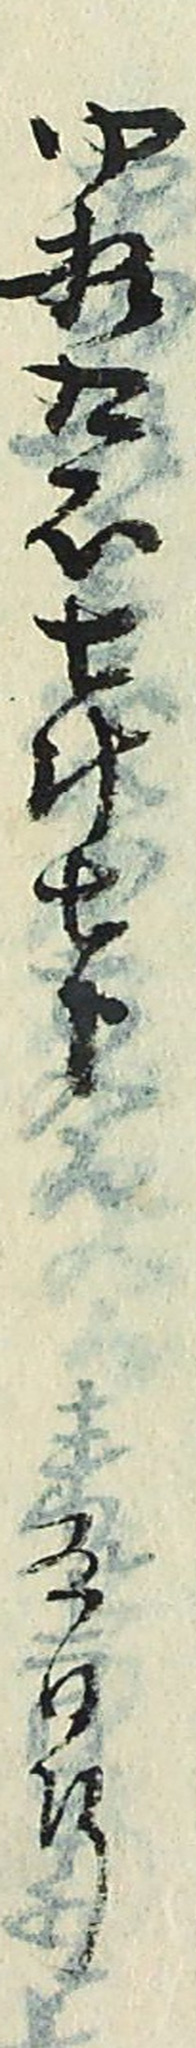内拾九石七斗七升右同断
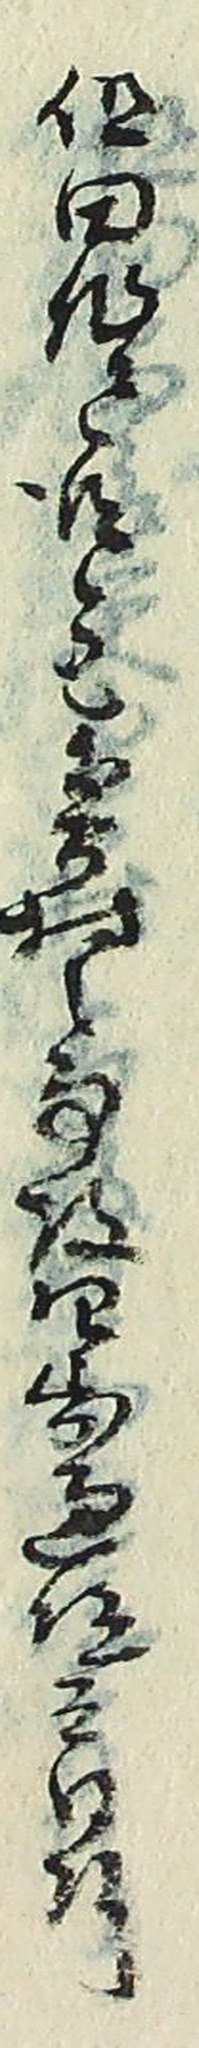但田作ニ候得とも貧村之事故四歩通位右同断
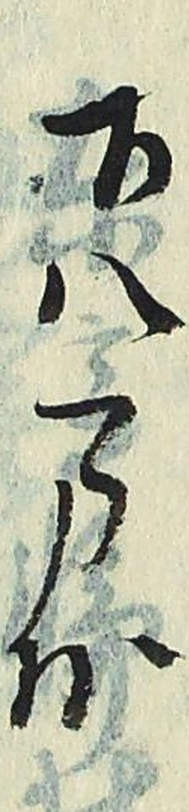下八万村
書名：諸御趣意書并御下知向之写
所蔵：鳴門教育大学 Naruto University of Education
